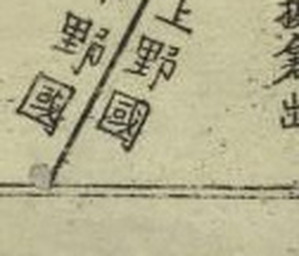下野国
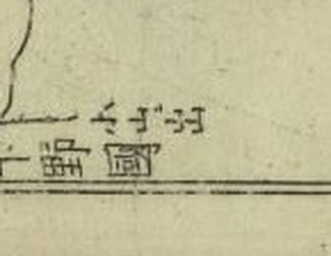下野国
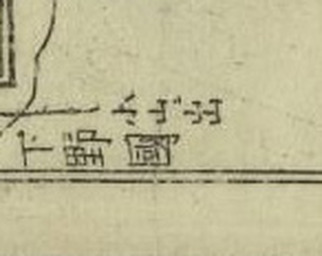下野国
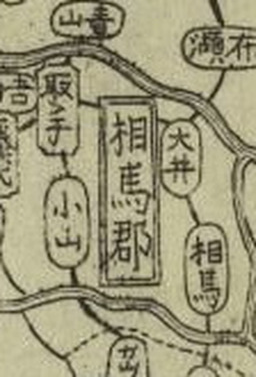相馬郡
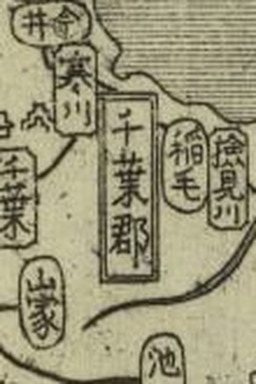千葉郡
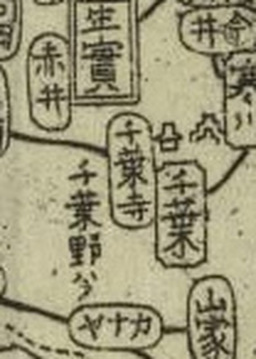千葉郡
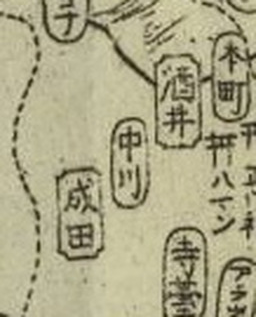中川出
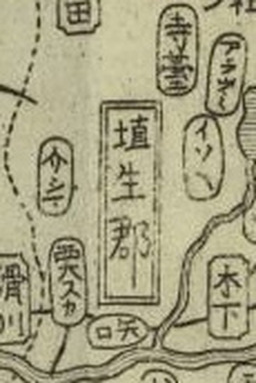埴生郡
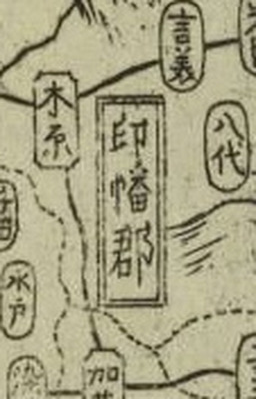印旛郡
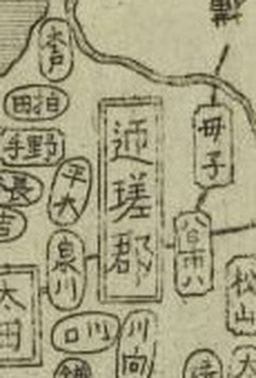逓瑳郡

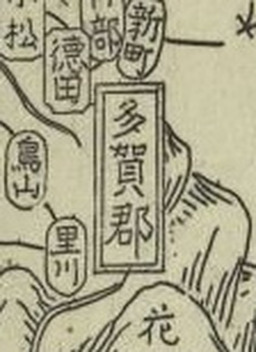多賀郡
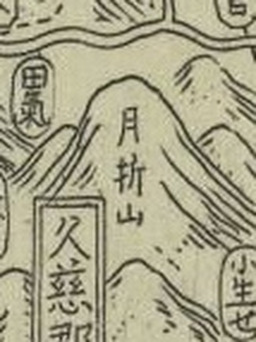月折山
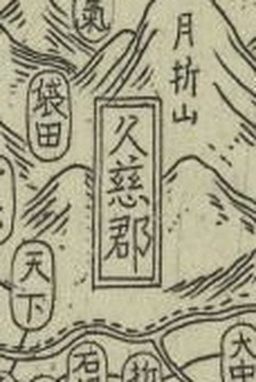久慈郡
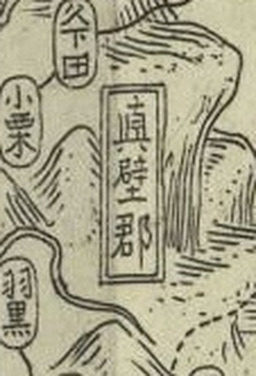真壁郡
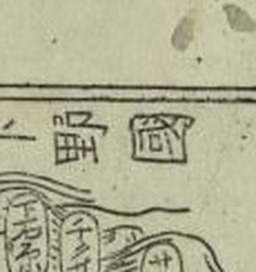下野國
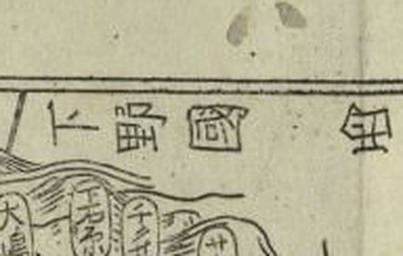下野國
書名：大日本国細図 東国之部 上
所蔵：University of the Ryukyus Library
